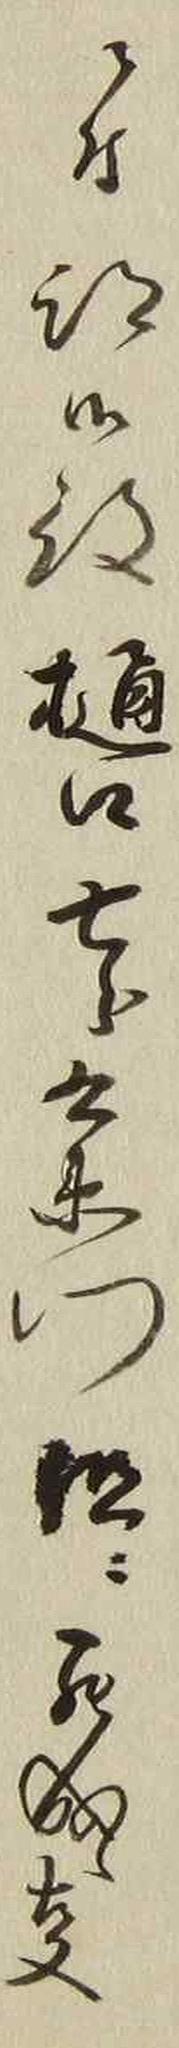ニ付跡御役樋口七郎右衛門組ニ罷成候事
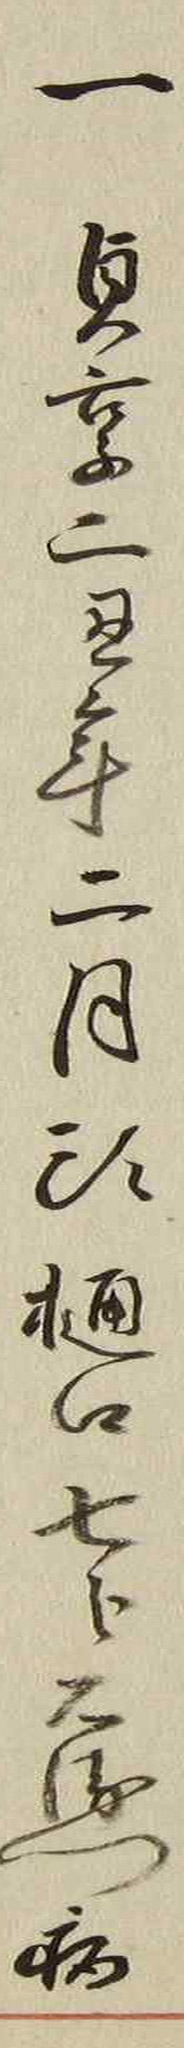一貞享二丑年二月頭樋口七郎右衛門病
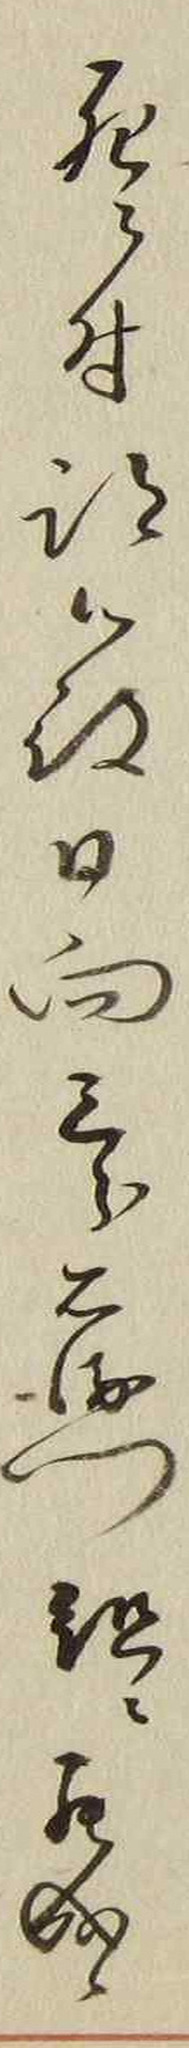死ニ付跡御役日向三郎右衛門組ニ罷成候
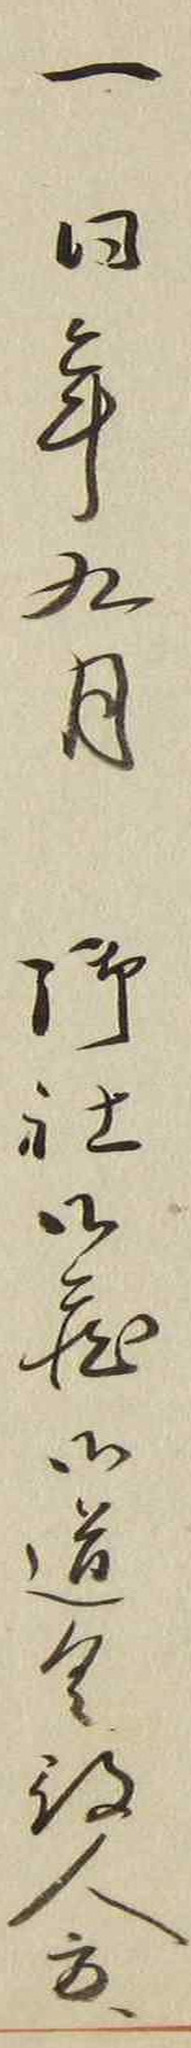一同年九月御社御蔵御道具役人方へ

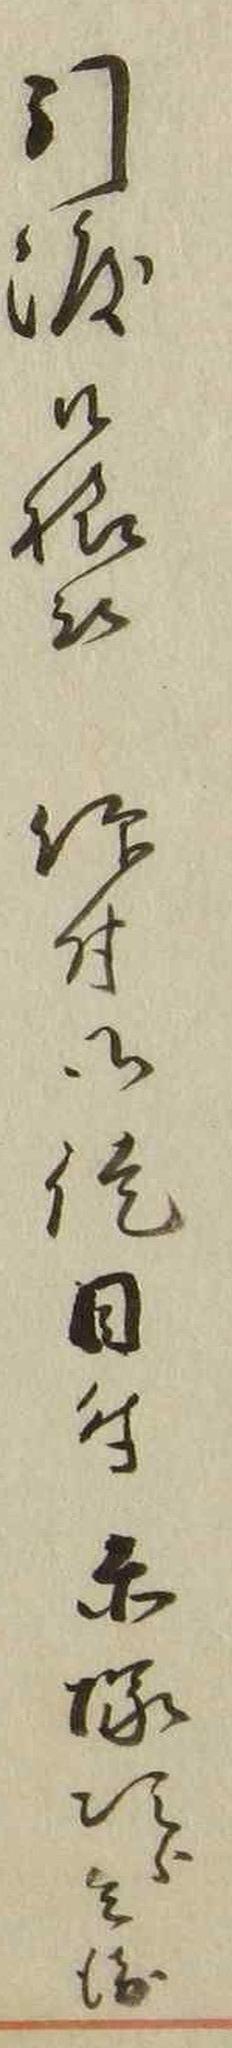引渡候様被仰付御徒目付赤塚次郎兵衛
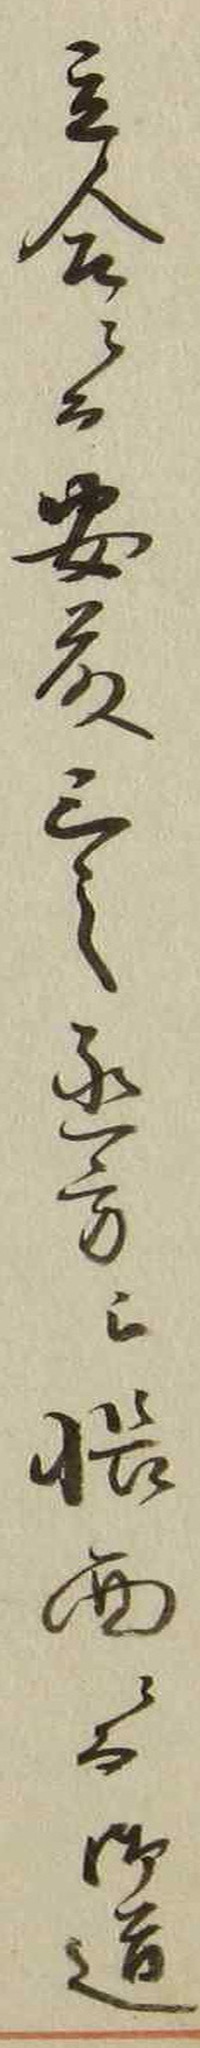立会ニ而安藤三之丞方江帳面ニ而御道
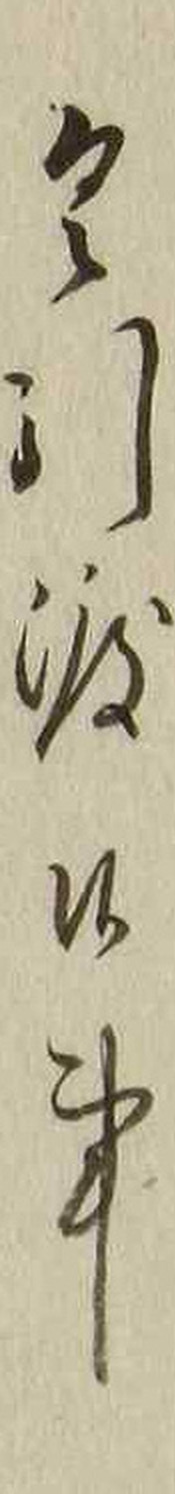具引渡候事
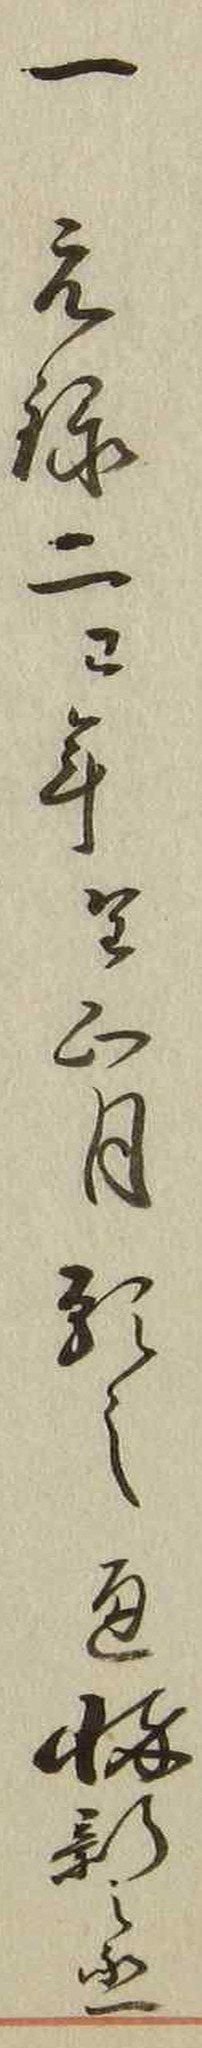一元禄二巳年閏正月願之通忰新之丞
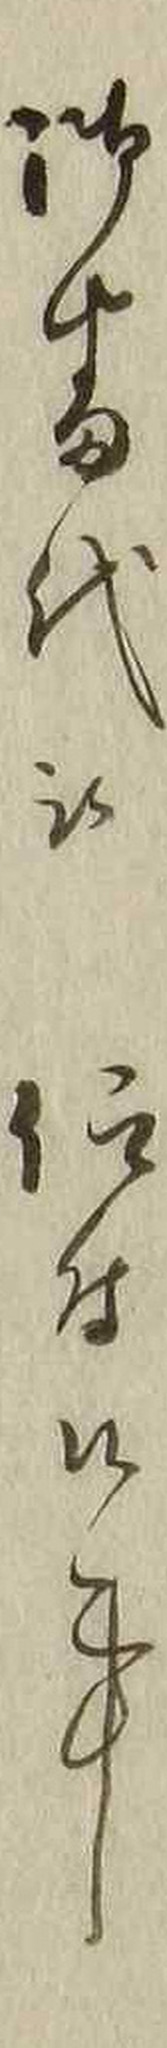御番代被仰付候事
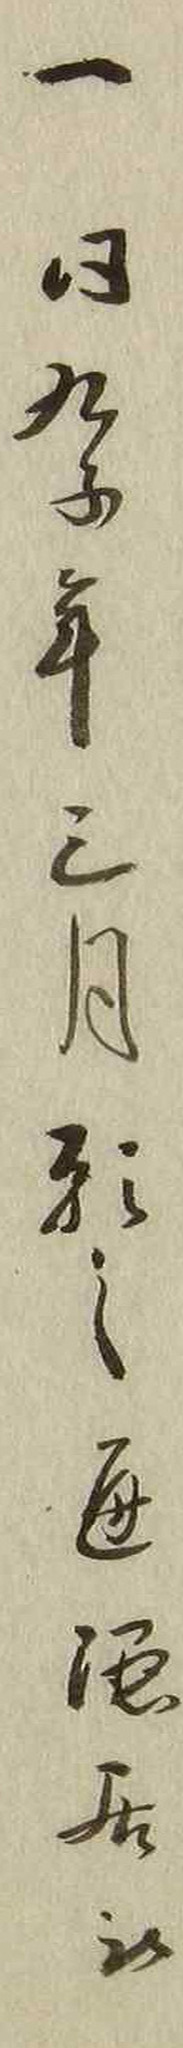一同九子年三月願之通隠居被
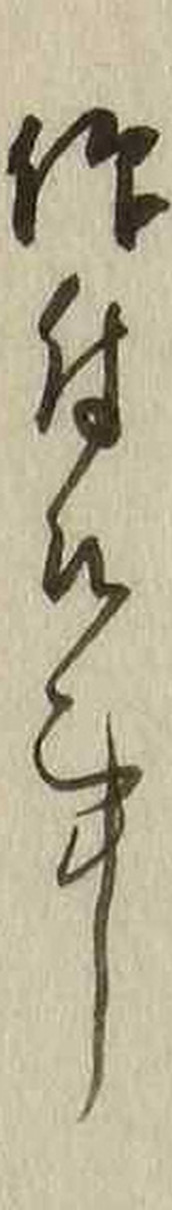仰付候事
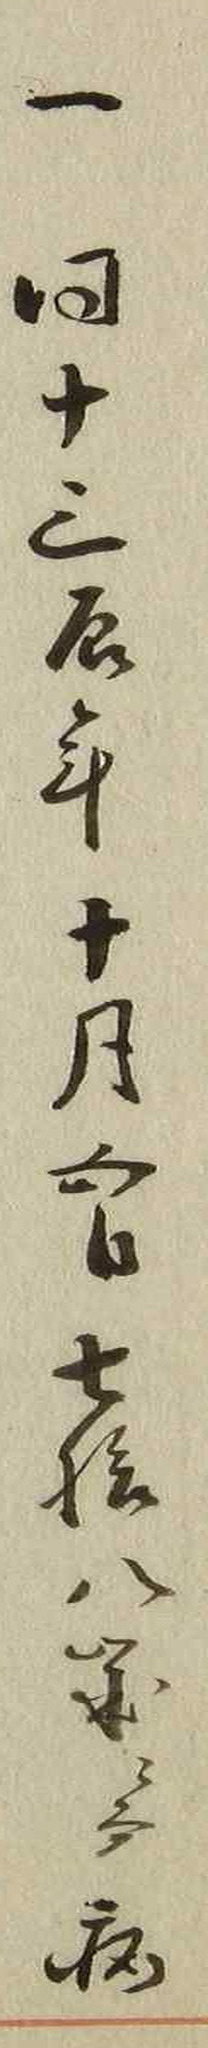一同十三辰年十月五日七拾八歳ニ而病
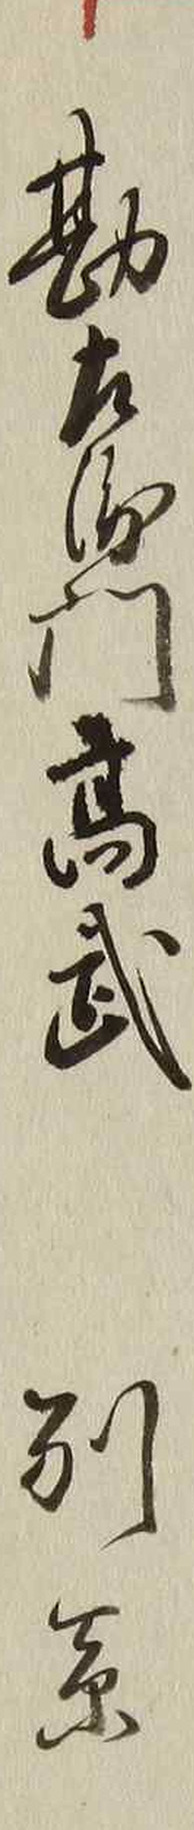勘左衛門高武別系
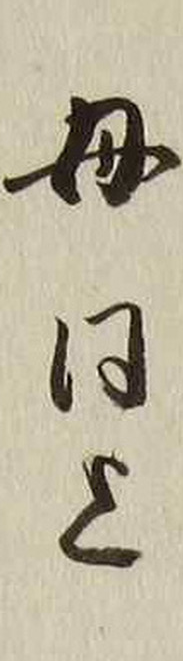母同上
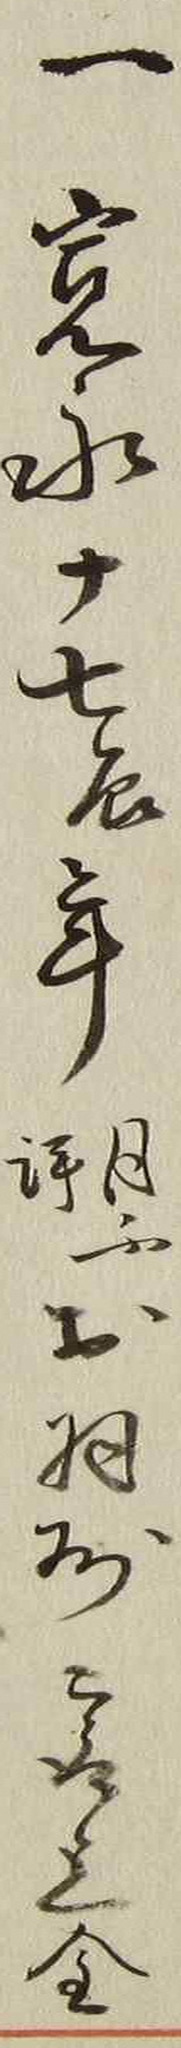一寛永十七辰年月不詳於羽州最上金
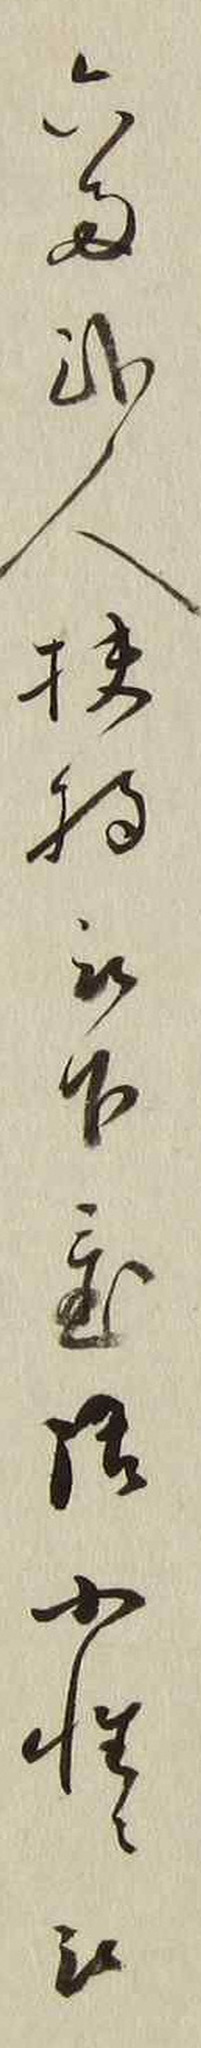六両弐人扶持被下置御小姓ニ被
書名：諸士系譜　巻之26　い之部26
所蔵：会津若松市立会津図書館
